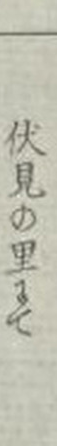伏見の里にて
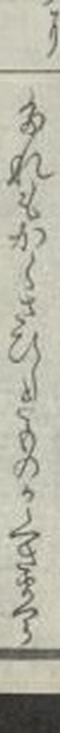たれもかくさひしきものかくさまくら
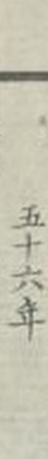五十六年
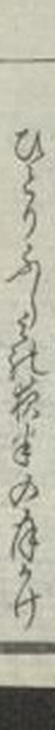ひとりふしみの夜半の月かけ
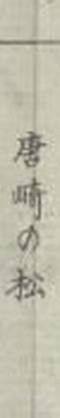唐崎の松
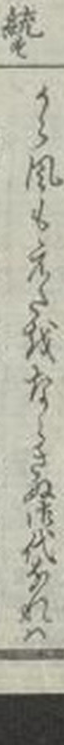うら風もえたをならさぬ御代なれは
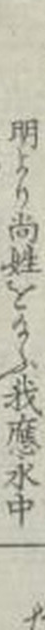明より尚姓を給ふ我応永中
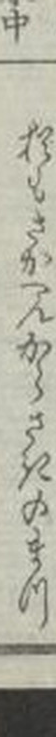猶もさかへんからさきのまつ
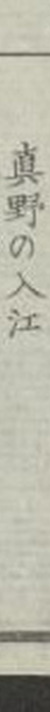真野の入江
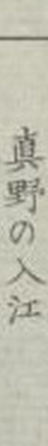真野の入江
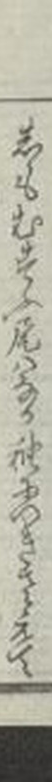しもむすふ尾はなか袖にいきさえて
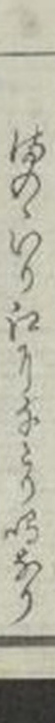まのゝいりえになとり鳴なり
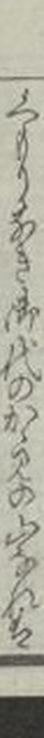くもりなき御代のかゝ見の山なれは
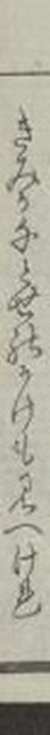きみか千とせのかけも見へけれ
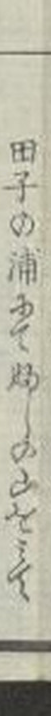田子の浦にてふしの山をみて
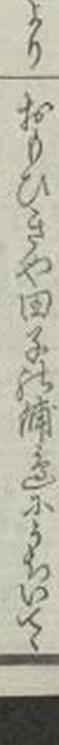おもひきや田子の浦辺にうちいてゝ
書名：中山国使略
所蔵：University of the Ryukyus Library
